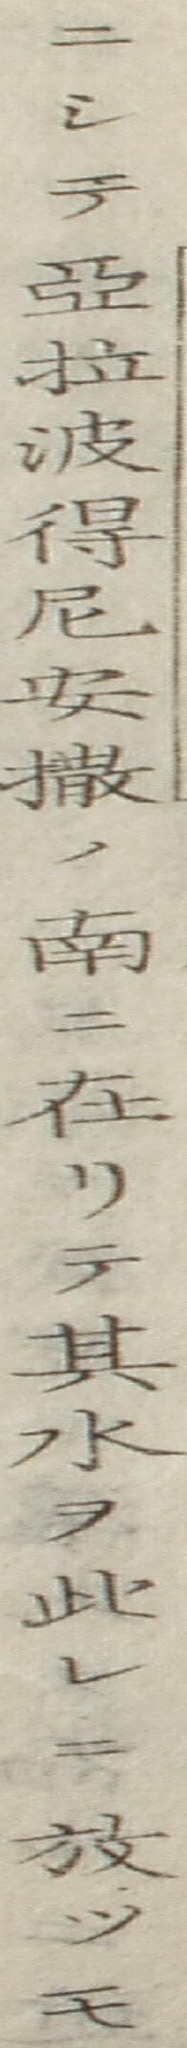ニシテ亜拉波得尼安撤ノ南ニ在リテ其水ヲ此レニ放ツモ
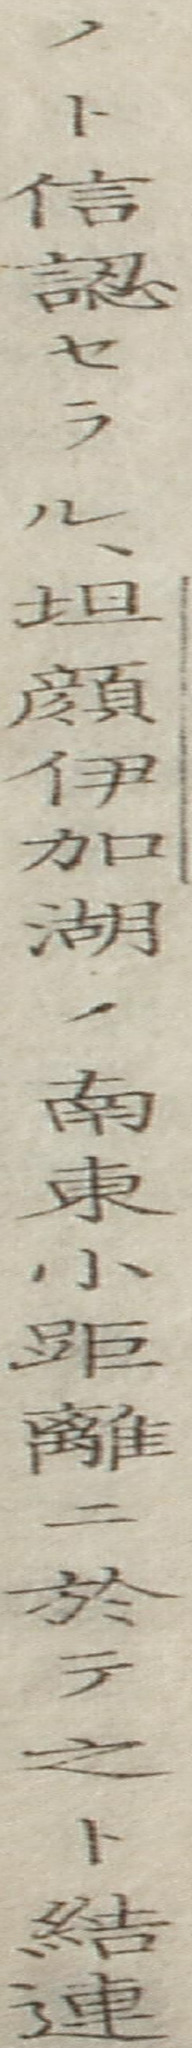ノト信認セラル、担顔伊加湖ノ南東小距離ニ於テ之ト結連
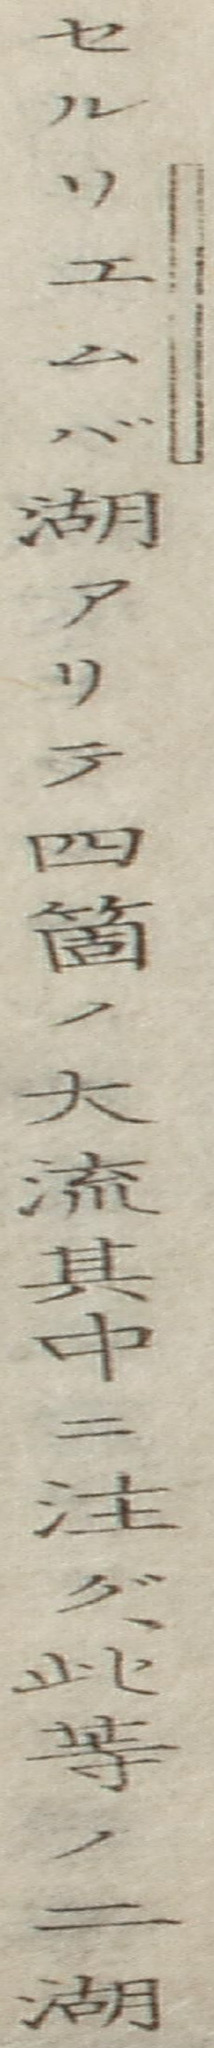セルリエムバ湖アリテ四箇ノ大流其中ニ注グ、此等ノ二湖

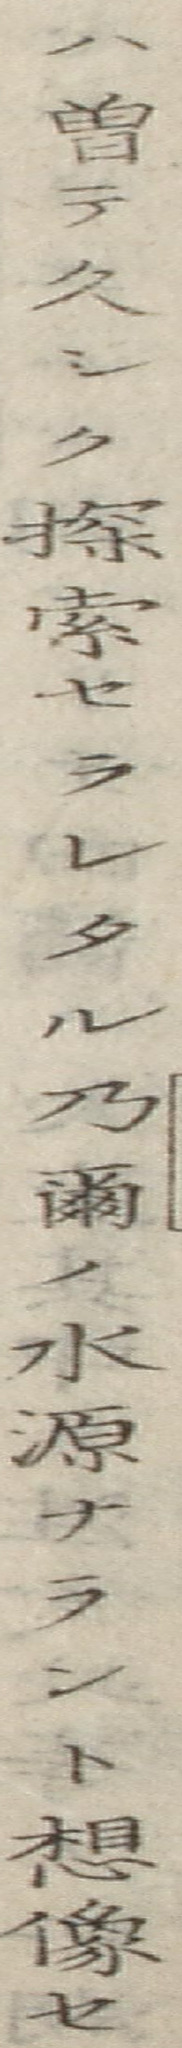ハ曽テ久シク探索セラレタル及爾ノ水源ナラント想像セ
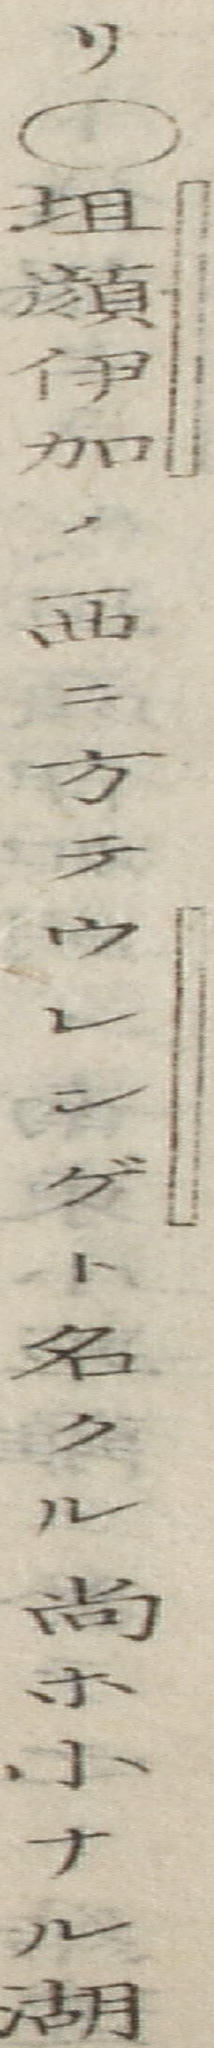リ○担顔伊加ノ西ニ方テウレンゲト名クル尚ホ小ナル湖
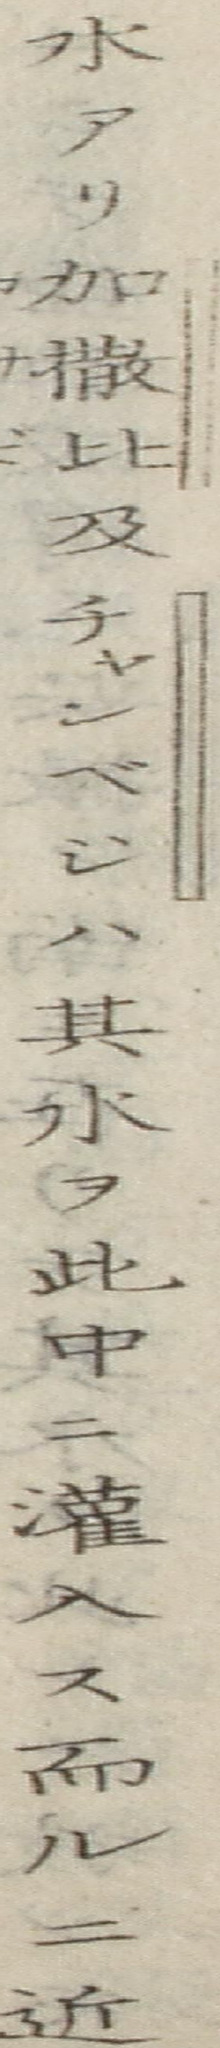水アリ加撤比及チャンベジハ其水ヲ此中ニ灌入ス而ルニ近
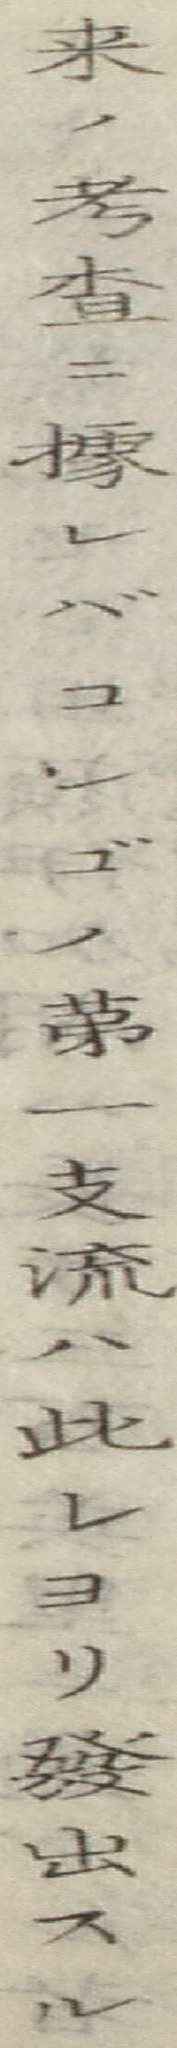来ノ考査ニ據レバコンゴノ第一支流ハ此レヨリ発出スル
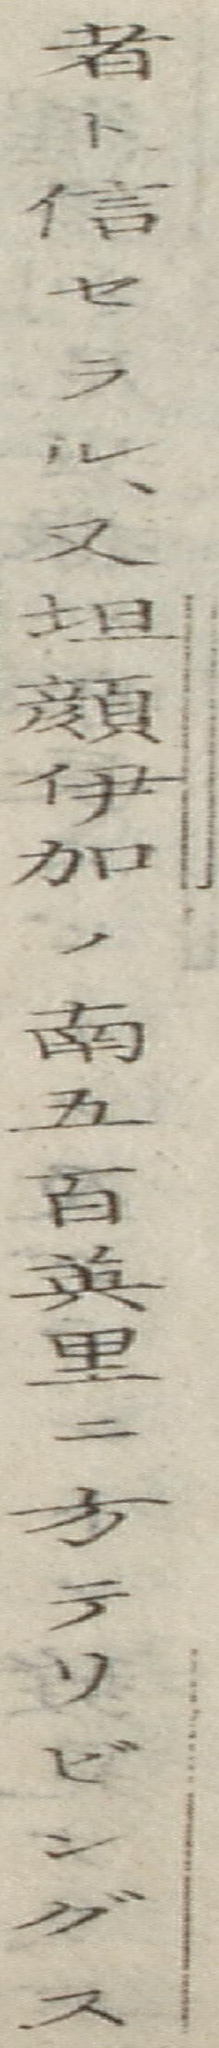者ト信セラル、又担顔伊加ノ南五百英里ニ方テリビングス
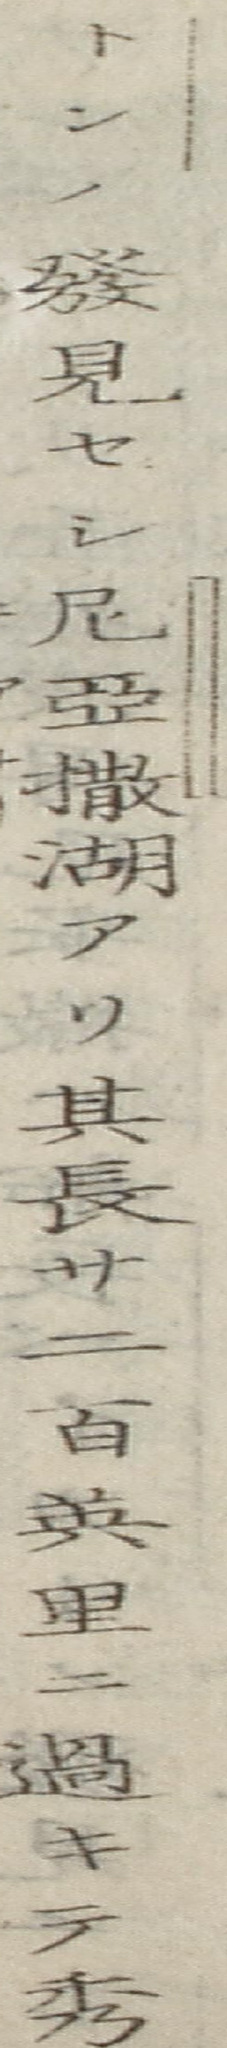トンノ発見セシ尼亜撤湖アリ其長サ二百英里ニ過キテ秀
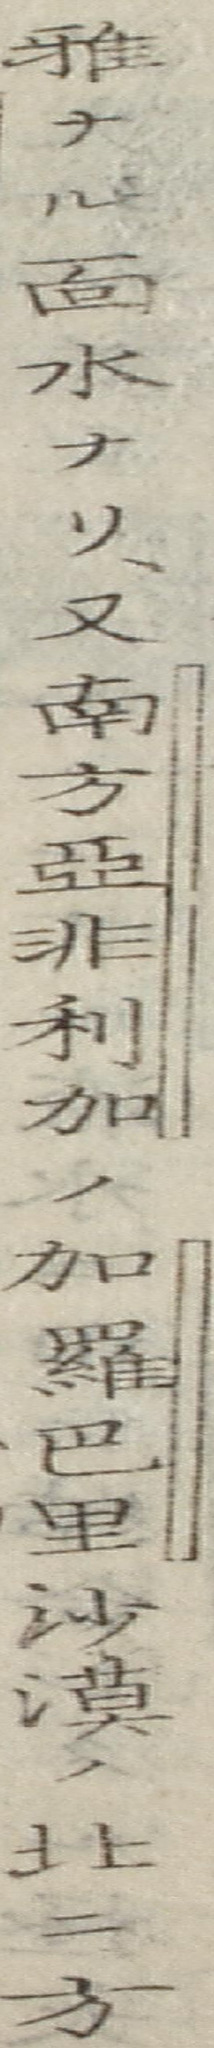雅ナル面水ナリ、又南方亜非利加ノ加羅巴里沙漠ノ北ニ方
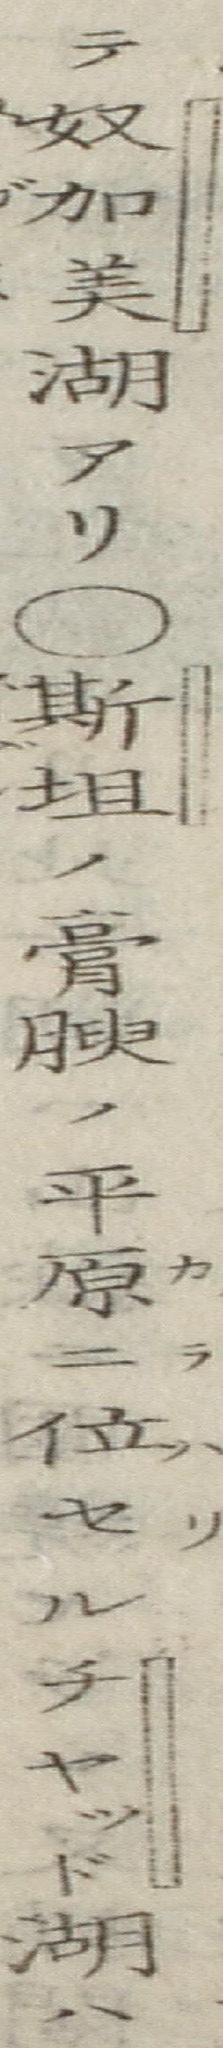テ奴加美湖アリ○斯担ノ膏腴ノ平原ニ位セルチャッド湖ハ
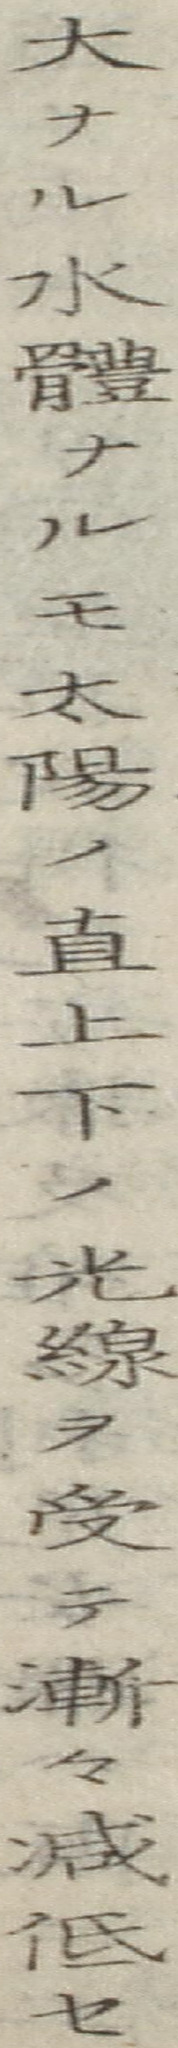大ナル水体ナルモ太陽ノ真上下ノ光線ヲ受テ漸々減低セ
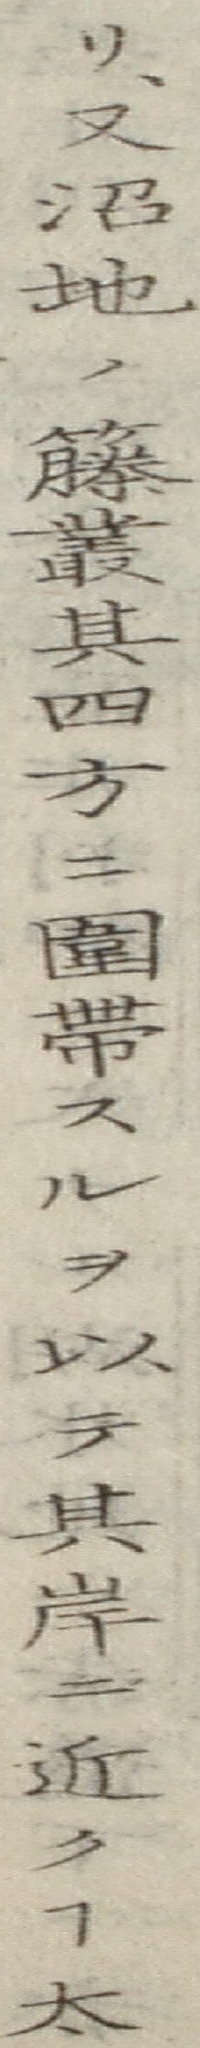リ、又沼地ノ藤叢其四方ニ囲帯スルヲ以テ其岸ニ近クヿ太
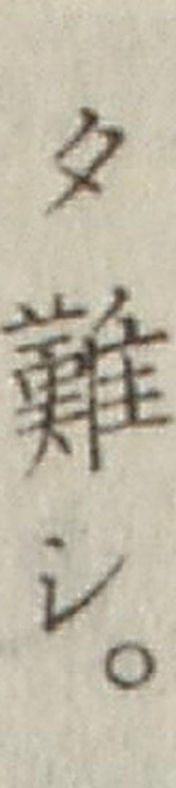タ難シ。
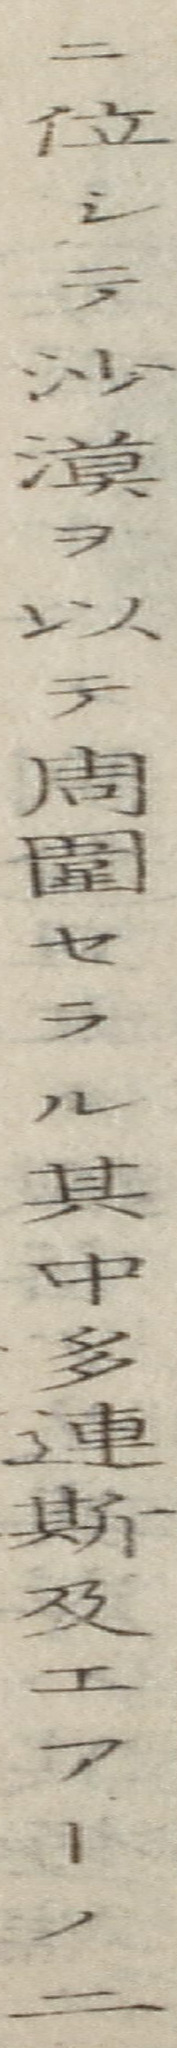ニ位シテ沙漠ヲ以テ周囲セラル其中多連斯及エアーノ二
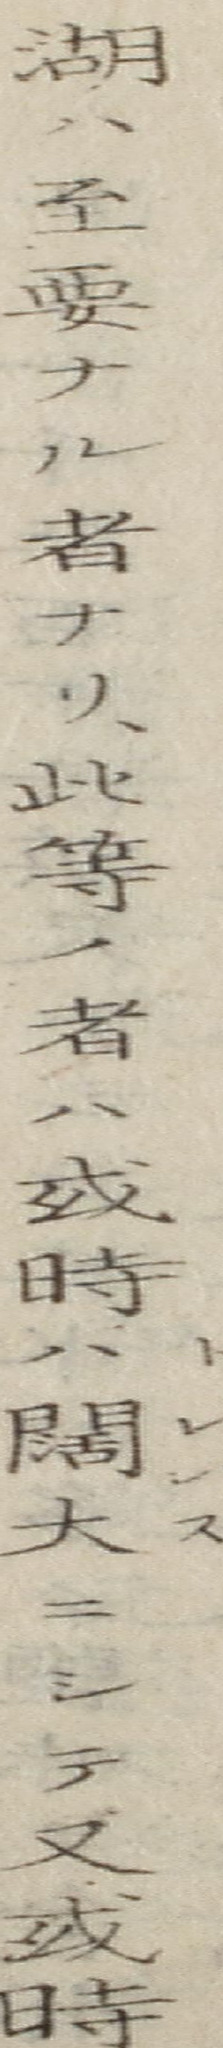湖ハ至要ナル者ナリ、此等ノ者ハ或時ハ闊大ニシテ又或時
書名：地形論　巻二
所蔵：東京大学地震研究所図書室 Earthquake Research Institute Library, The University of Tokyo, JAPAN
